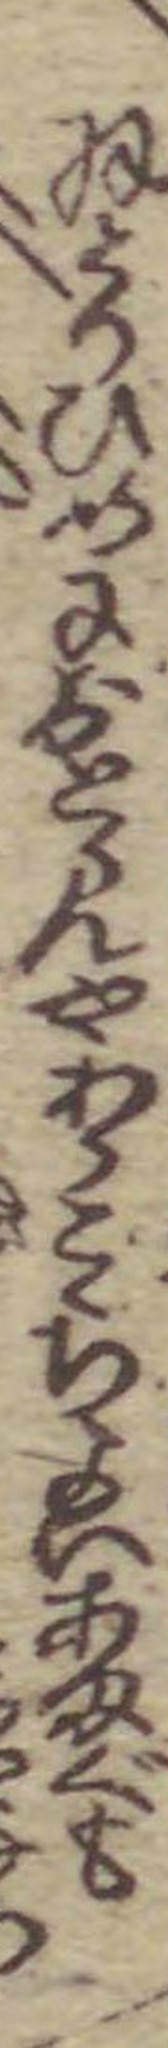羽とりひめにおとらんやわらこゝちよいあまぐも
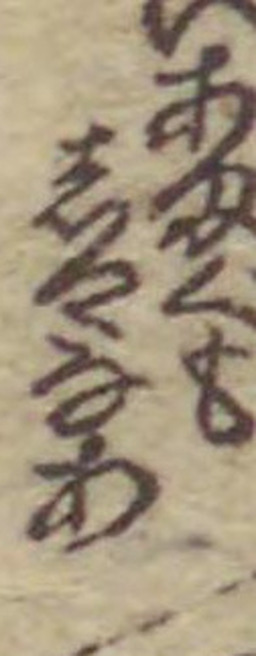しやなあ

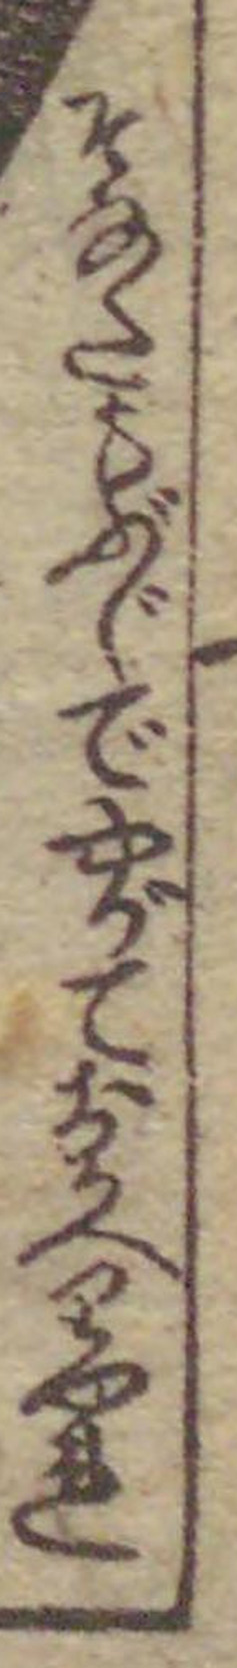そなたもぶじでやがておかへりやれ
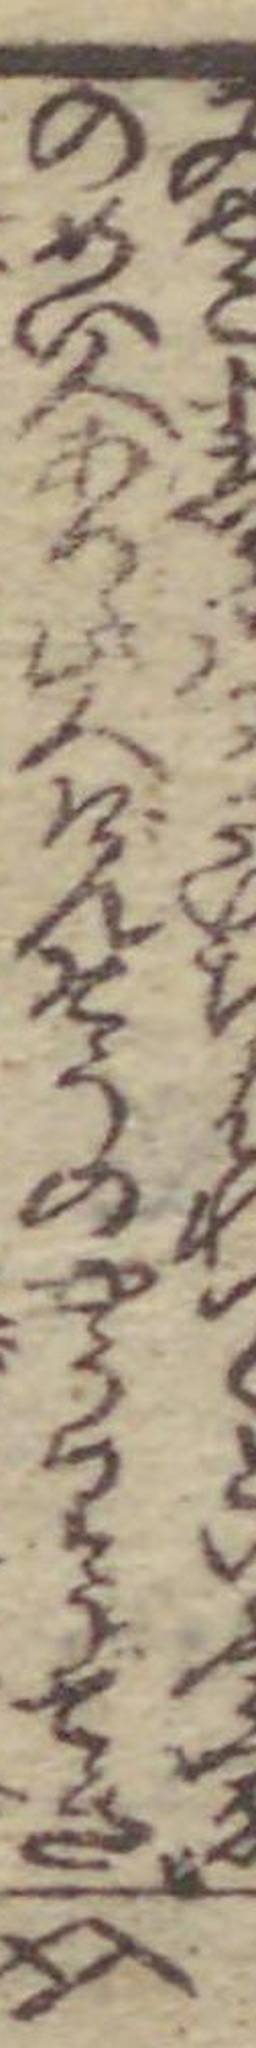のめい人あり此人げんそうのやうりうてき
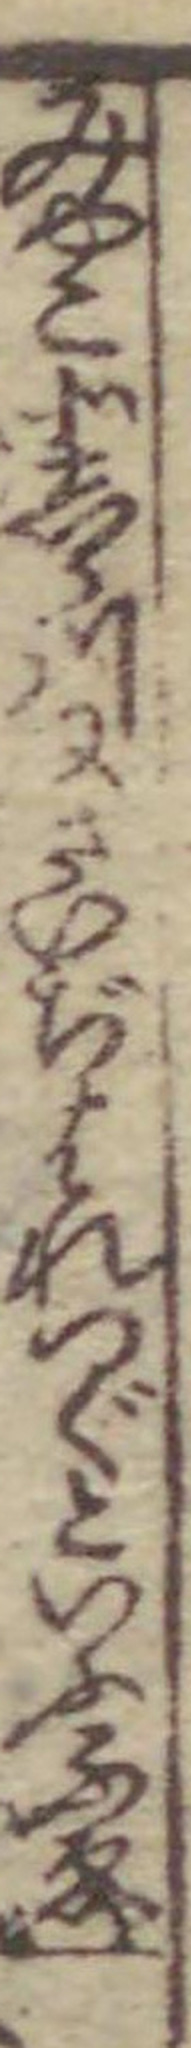みやこ北しら川にさいぢはれつぐといふふゑ
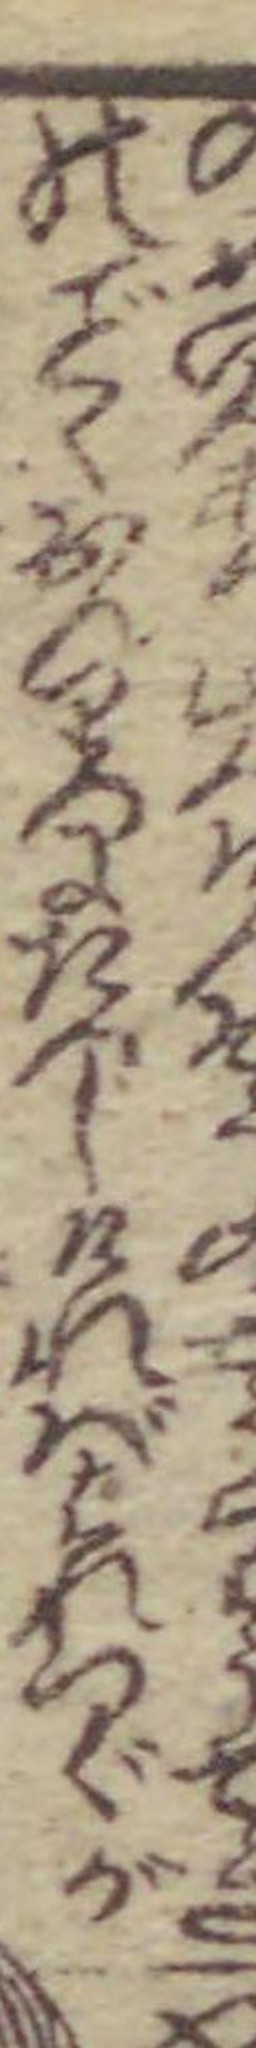のごとくおんりつにたつしければはれつぐが
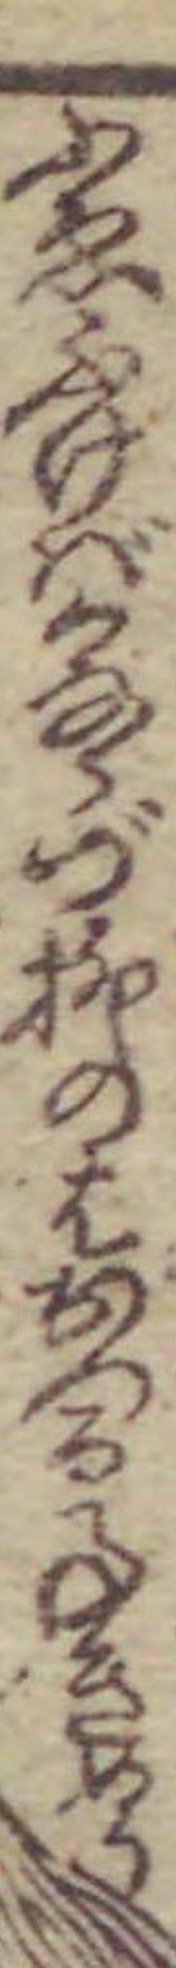ふゑふけばかならづ柳のはおつる事きめう
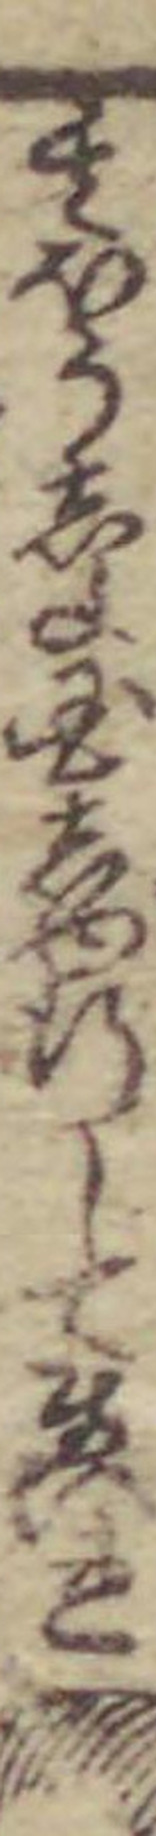其ほうしよ国しゆ行してまいれ
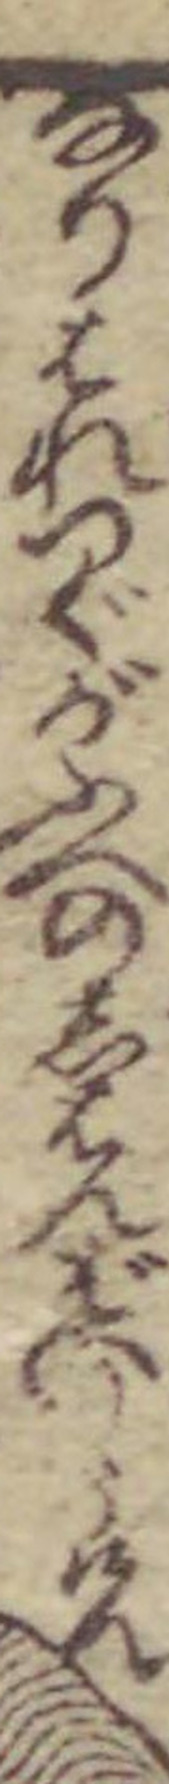なりはれつぐがふへのしはんばいりうけん
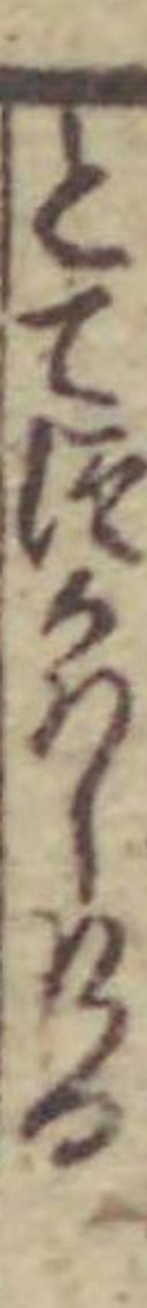とてつかはしける
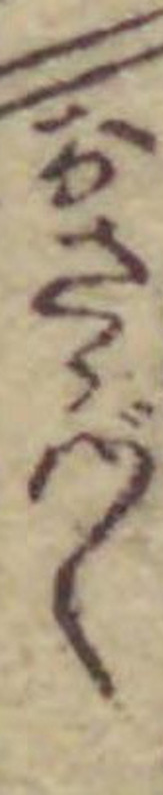おさらば〳〵
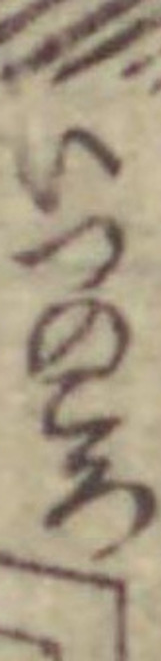いつのころ
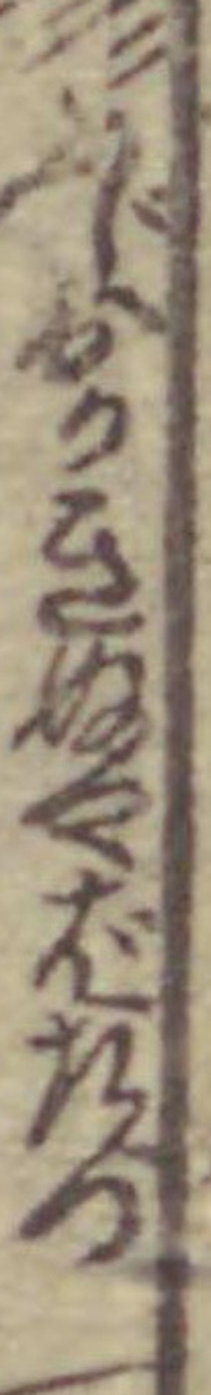ふじおかきぬやば左衛門
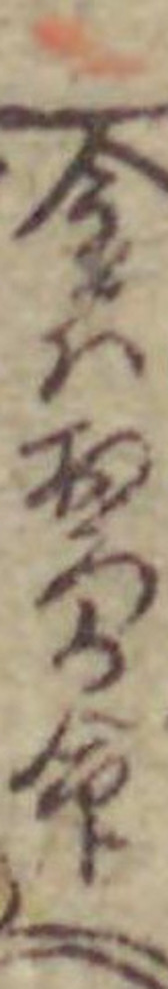金はおろか命
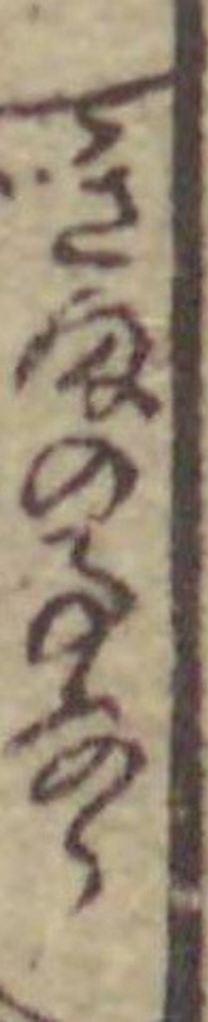きさまの事なら
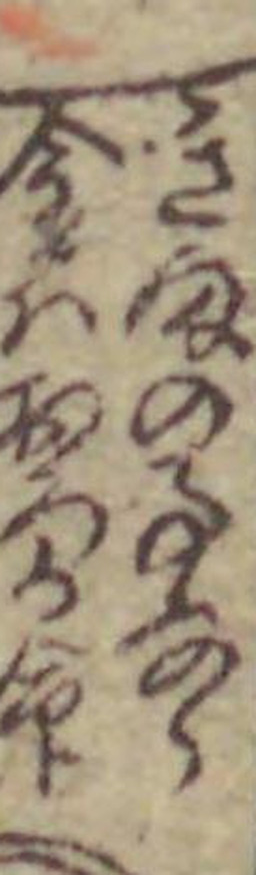金はおろか命
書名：娜二代鉢木 5巻
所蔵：国立国会図書館 National Diet Library, JAPAN
